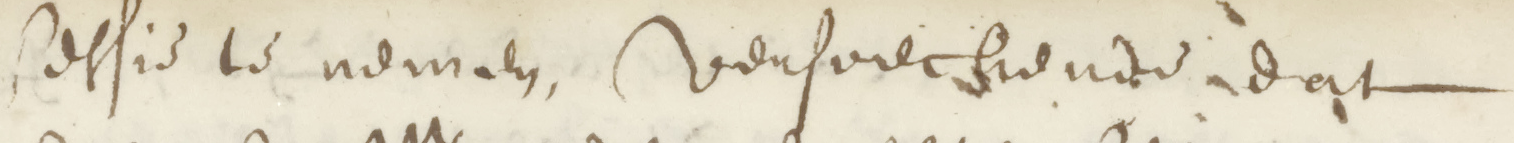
sessie te nemen, versoeckende dat
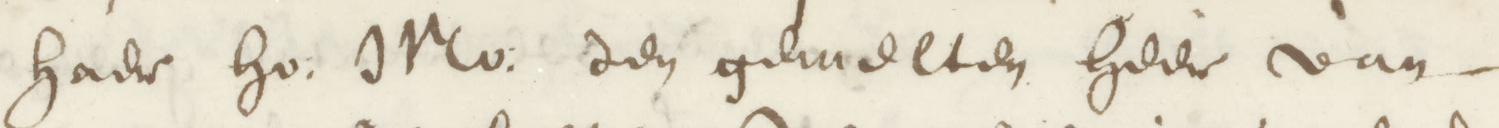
haer ho:Mo: den gemelten heer van
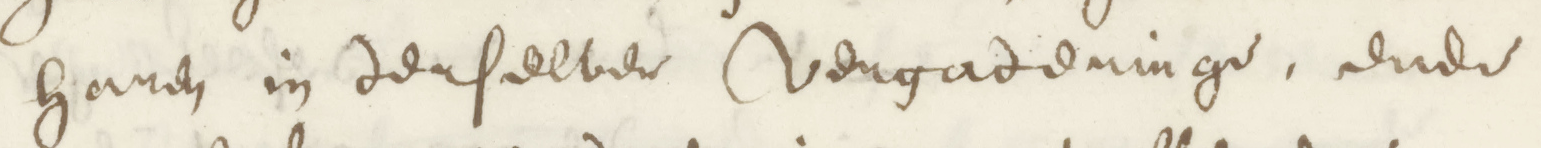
haren in derselver vergaderinge, ende
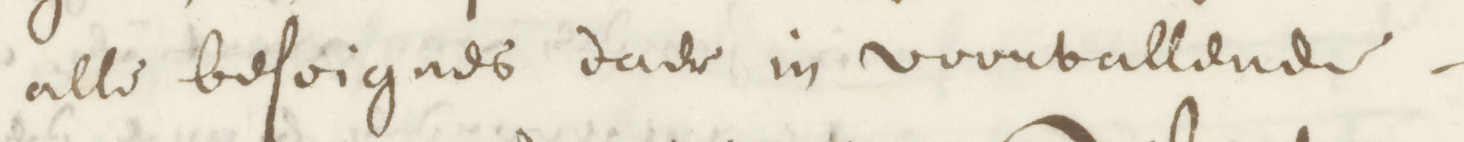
alle besoignes daer in voorvallende
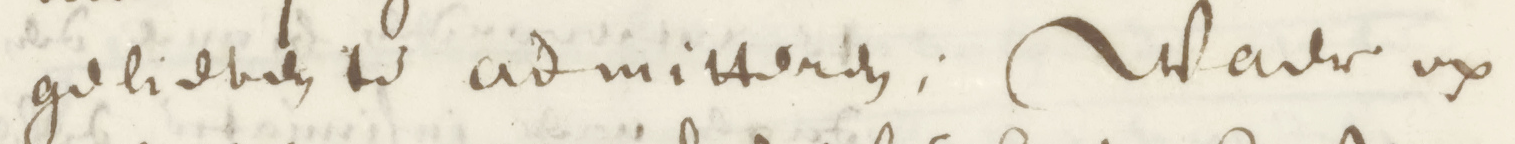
gelieven te admitteren: Waer op
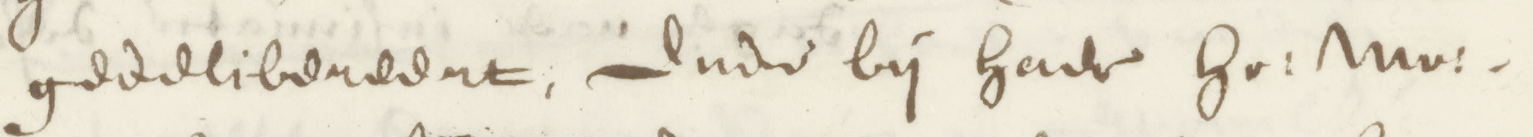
gedelibereert, ende bij haer ho:mo:
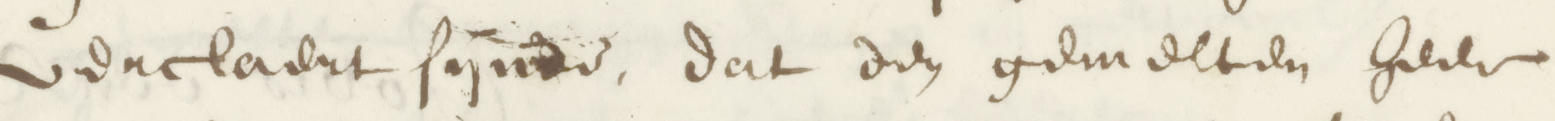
verclaert sijnde, dat den gemelten heer
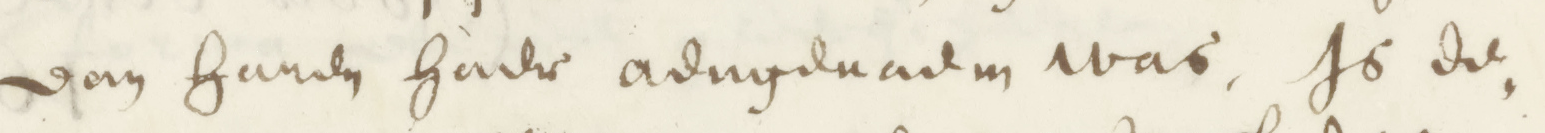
van haren haer aengenaem was. Is de
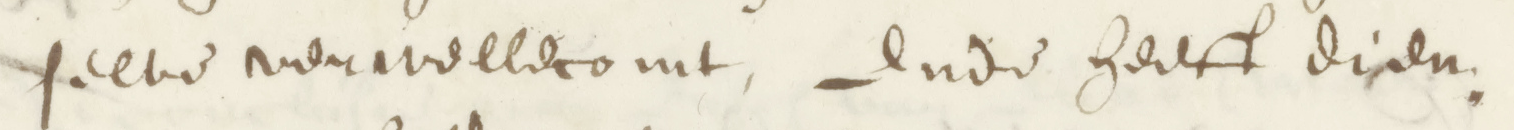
selve verwellecomt, ende heeft dijen„
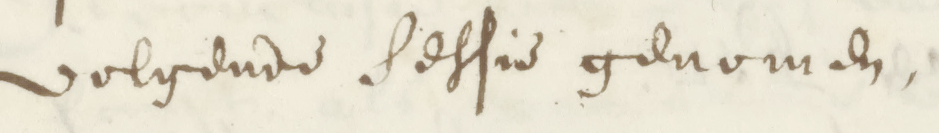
volgende sessie genomen.
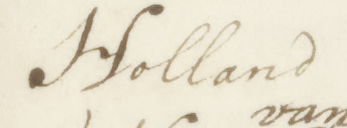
Holland
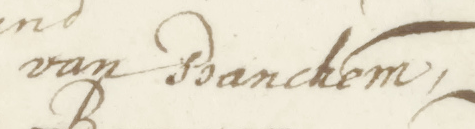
van Banchem.
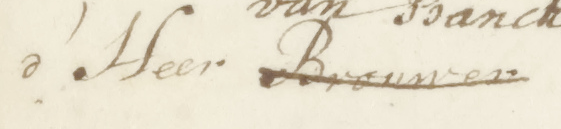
d'Heer Brouwer
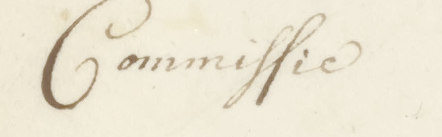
Commissie
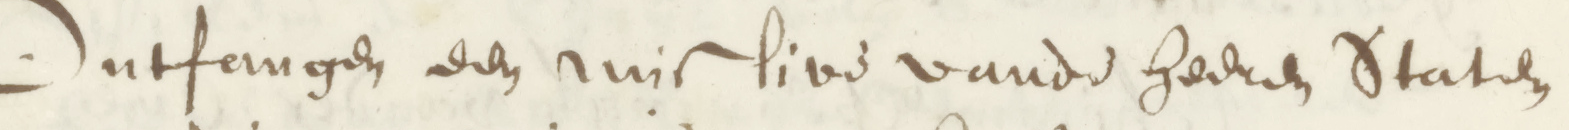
Ontfangen een missive vande heeren Staten
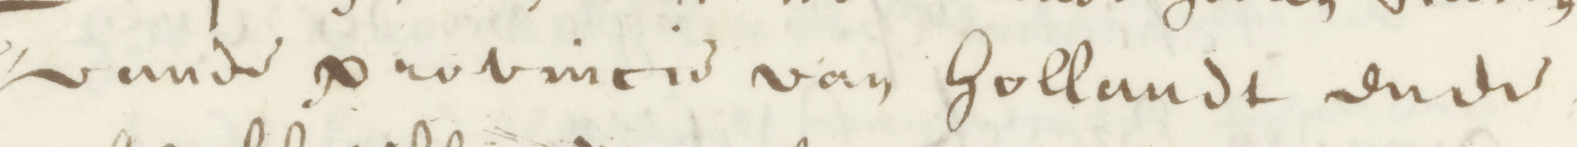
vande provincie van hollandt ende
